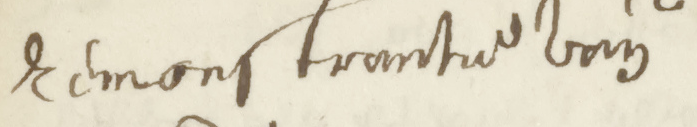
remonstrantie van
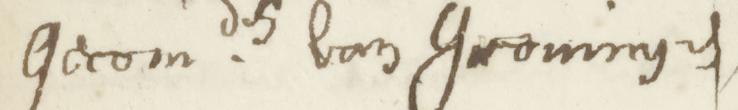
Gecomden. van Groninngen
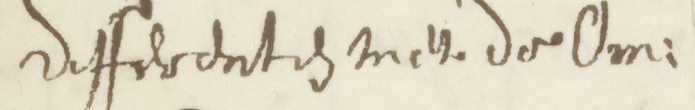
differenten met de Om:
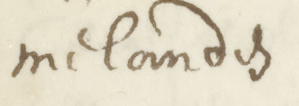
melanden
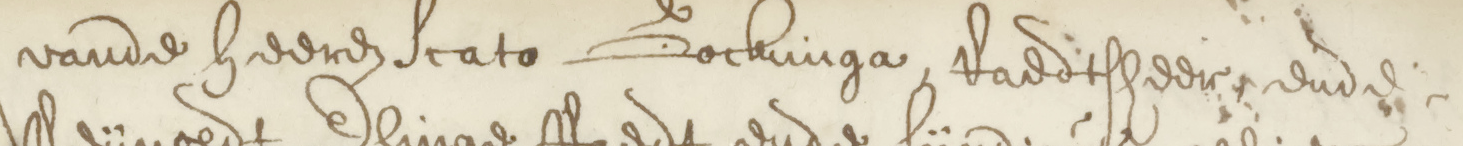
vande heeren Scato Gockinga, Raedtsheer, ende
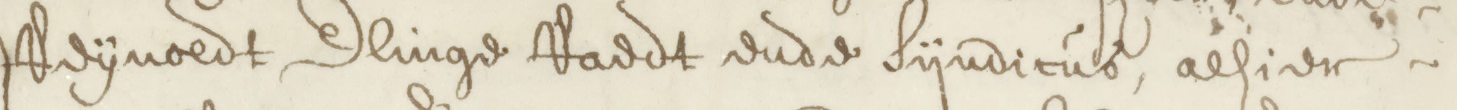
Reijnoldt Elinge Raedt ende Sijndicus, alhier
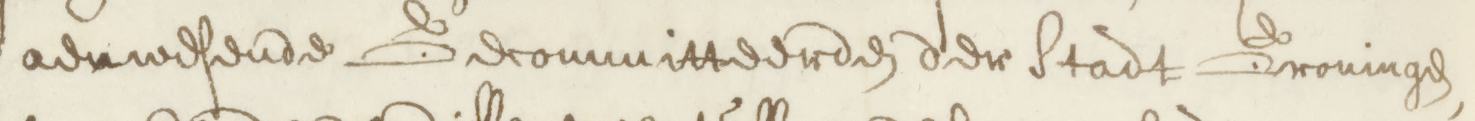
aenwesende Gecommitteerden der Stadt Groningen,
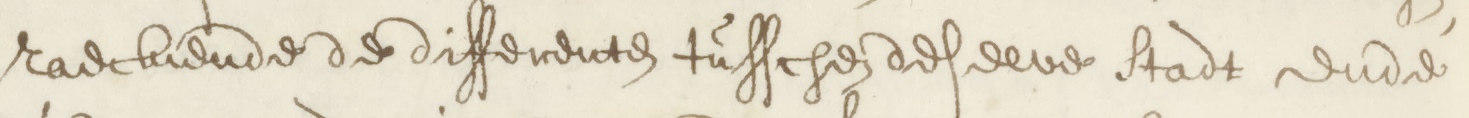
raeckende de differenten tusschen deselve Stadt ende
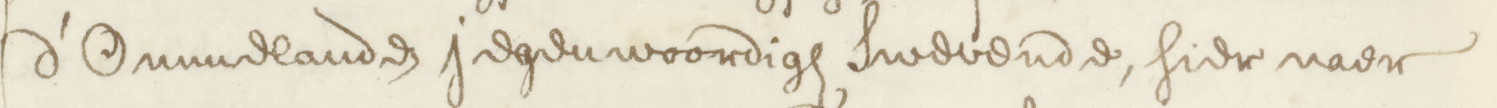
d'Ommelanden jegenwoordigh Swevende, hier naer
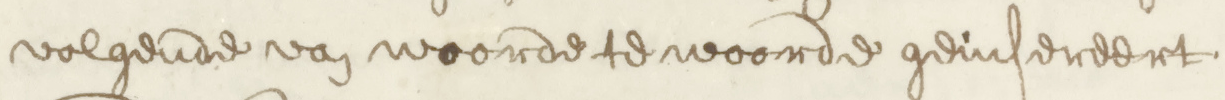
volgende van woorde te woorde geinsereert.
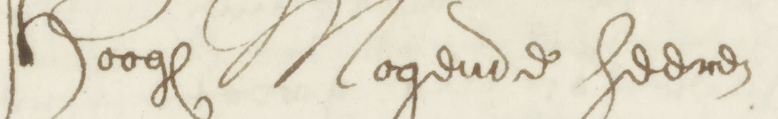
Hoogh Mogende heeren.
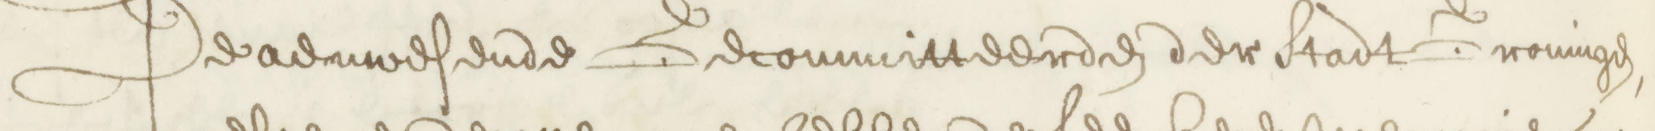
De aenwesende Gecommitteerden der Stadt Groningen,
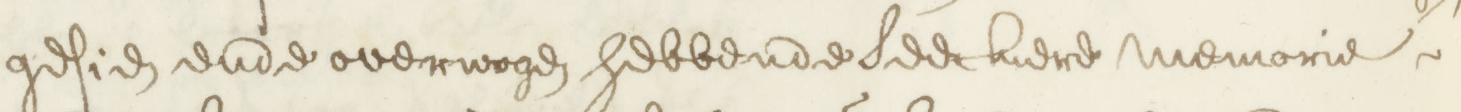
gesien ende overwogen hebbende Seeckere memorie
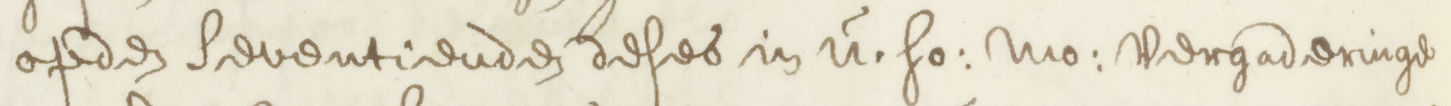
opden Seventienden deses in U. ho:Mo: Vergaderinge
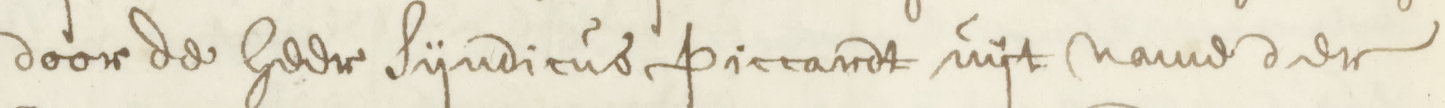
door de heer Sijndicus Piccardt uijt name der
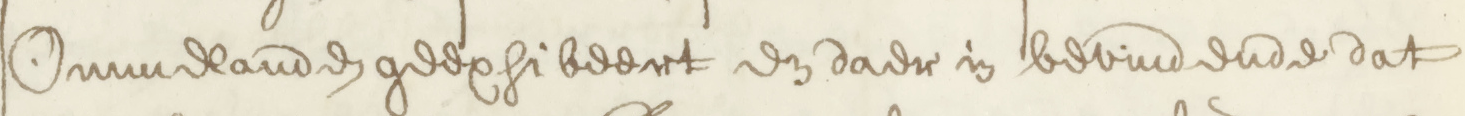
Ommelanden geexhibeert en daer in bevindende dat
